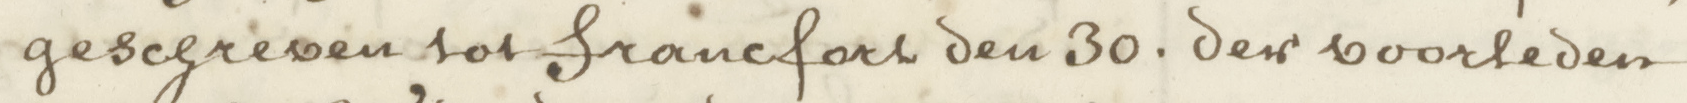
geschreven tot Francfort den 30. der voorleden
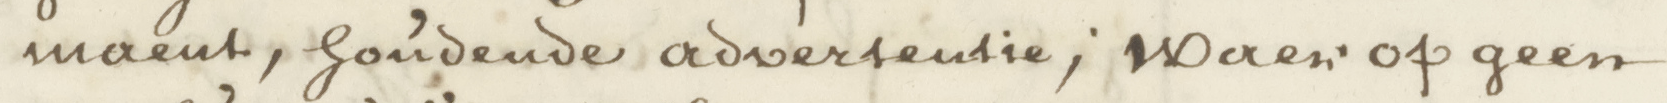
maent, houdende advertentie; Waer op geen
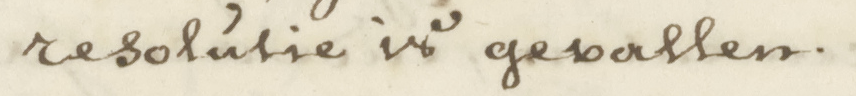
resolutie is gevallen.
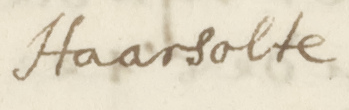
Haarsolte
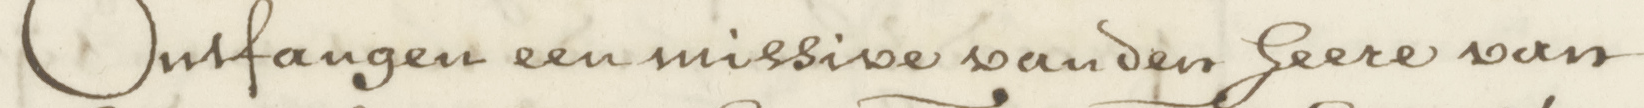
Ontfangen een missive van den heere van
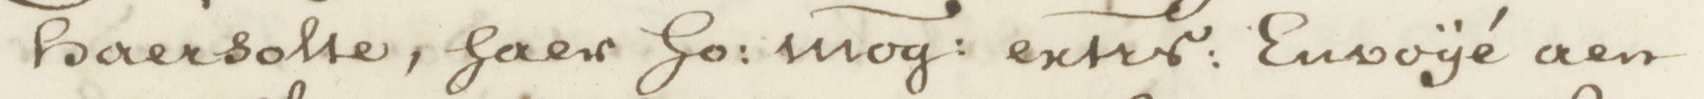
Haersolte, haer Ho:Mog: extrs: Envoijé aen
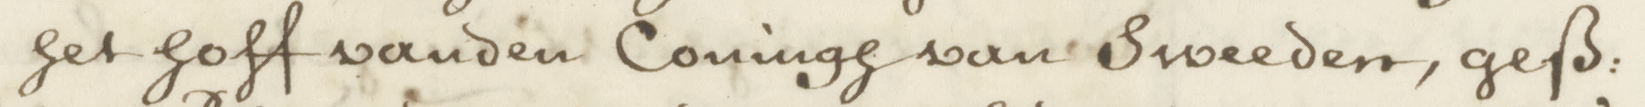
het hoff vanden Coningh van Sweeden, ges:
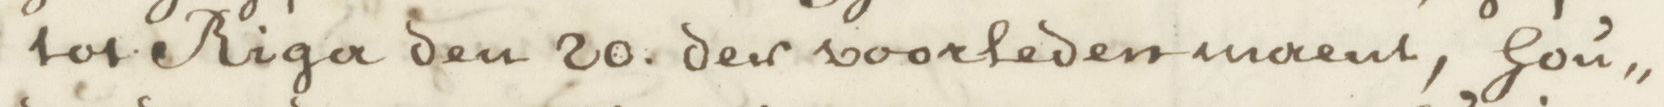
tot Riga den 20. der voorleden maent, hou„
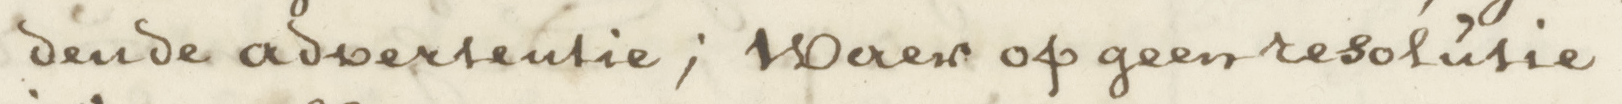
dende advertentie; Waer op geen resolutie
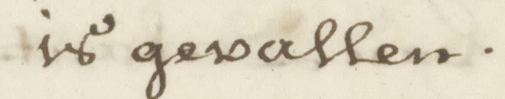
is gevallen.
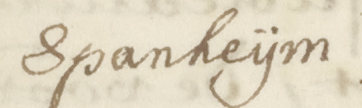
Spanheijm.
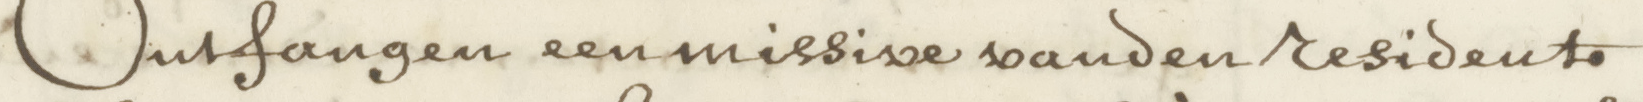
Ontfangen een missive vanden resident
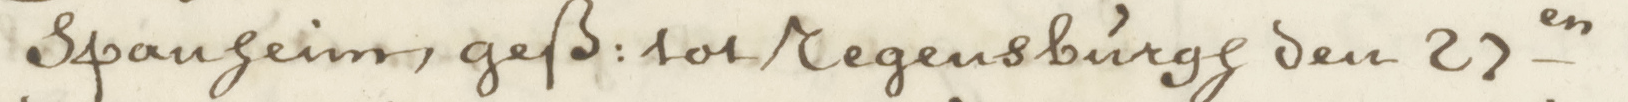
Spanheim, ges: tot Regensburgh den 27en
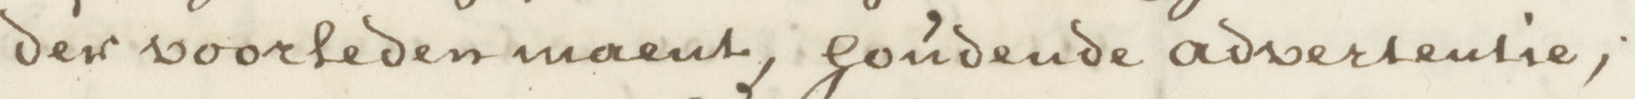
der voorleden maent, houdende advertentie;
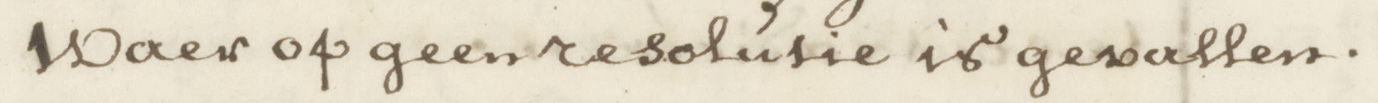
Waer op geen resolutie is gevallen.
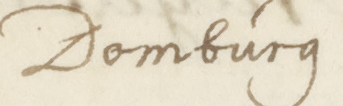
Domburg
